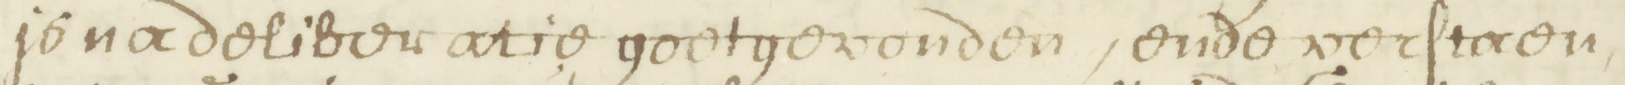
is na deliberatie goetgevonden, ende verstaen,
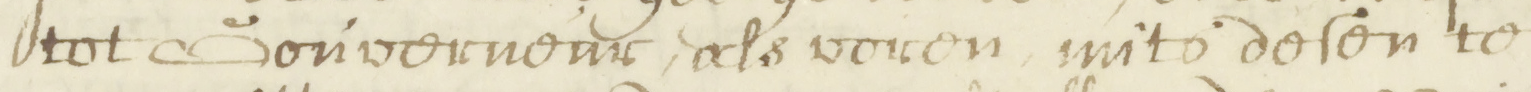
tot Gouverneur, als voren, mits desen te
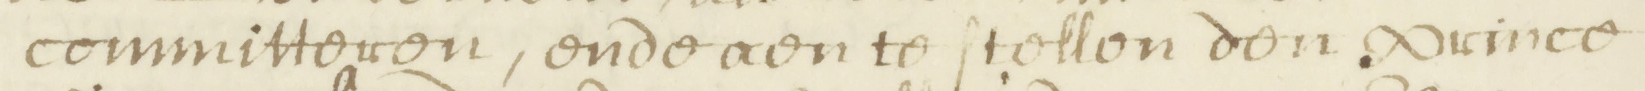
committeren, ende aen te stellen den Prince
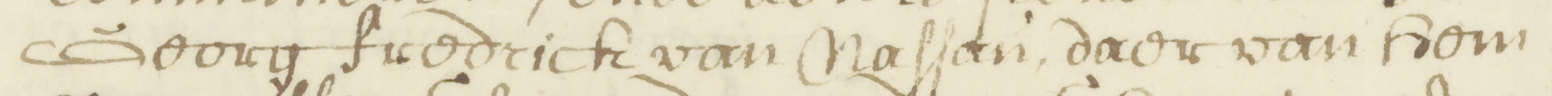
Georg fredrick van Nassau, daer van hem
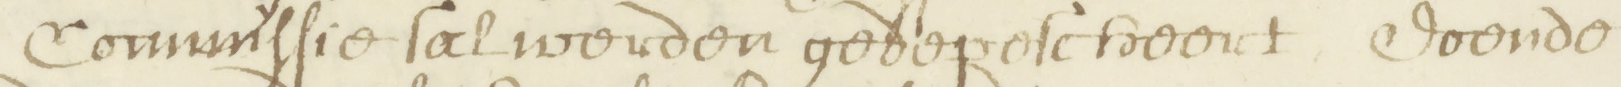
Commissie sal werden gedepescheert, Doende
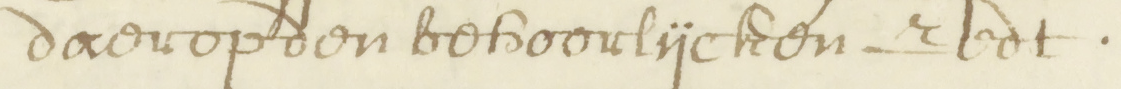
daerop den behoorlijcken Eedt.
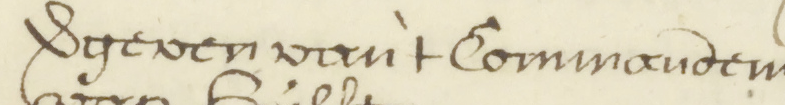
vgeven van't Commandemt
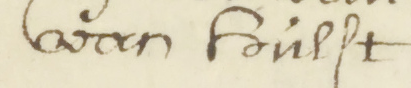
van Hulst
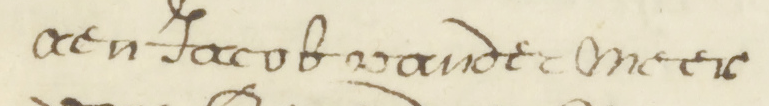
aen Jacob vander Meer
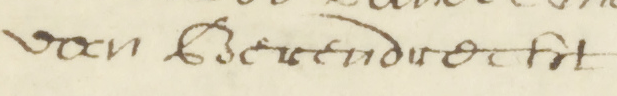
van Berendrecht
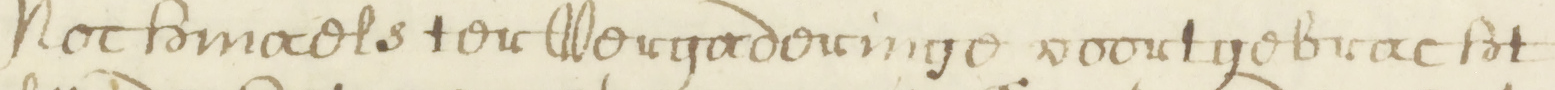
Nochmaels ter Vergaderinge voortgebracht
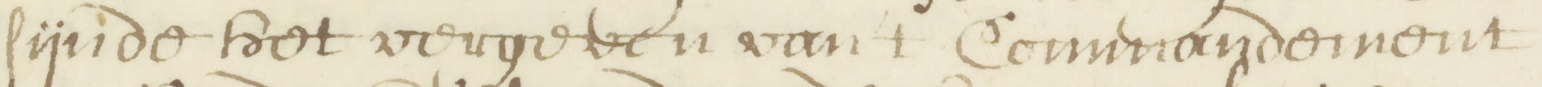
sijnde het vergeven van 't Commandement
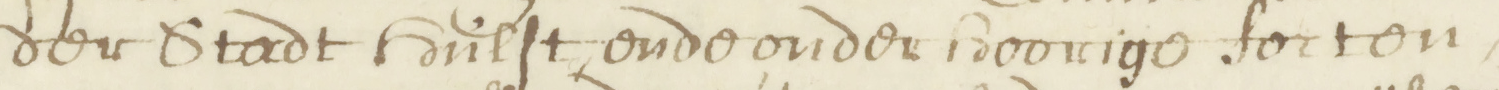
der Stadt Hulst ende onderhoorige forten
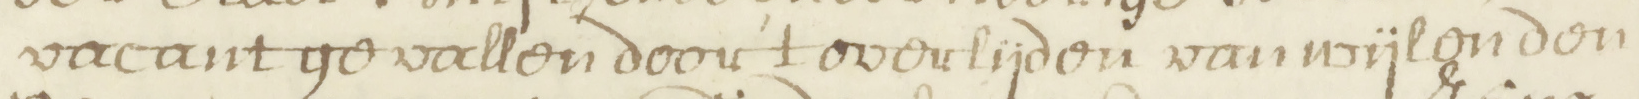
vacant gevallen door 't overlijden van wijlen den
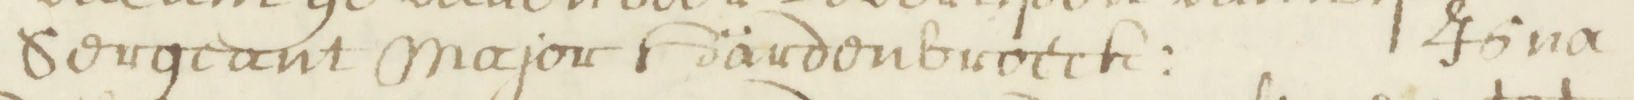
Sergeant Major Hardenbroeck: Is na
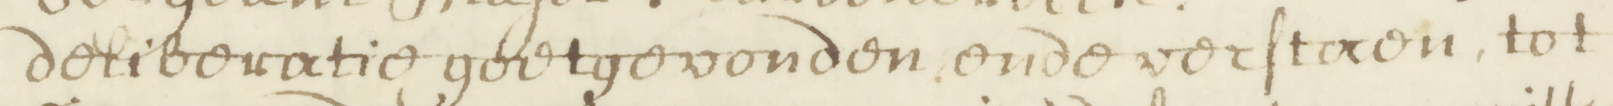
deliberatie goetgevonden, ende verstaen, tot
